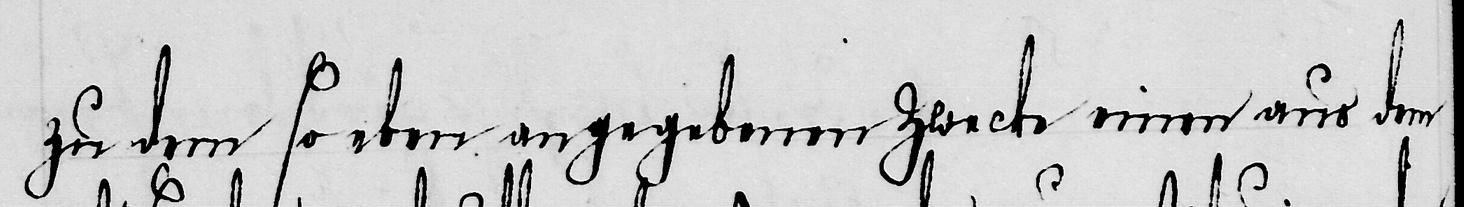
zu dem soeben angegebenen Zwecke einen aus dem
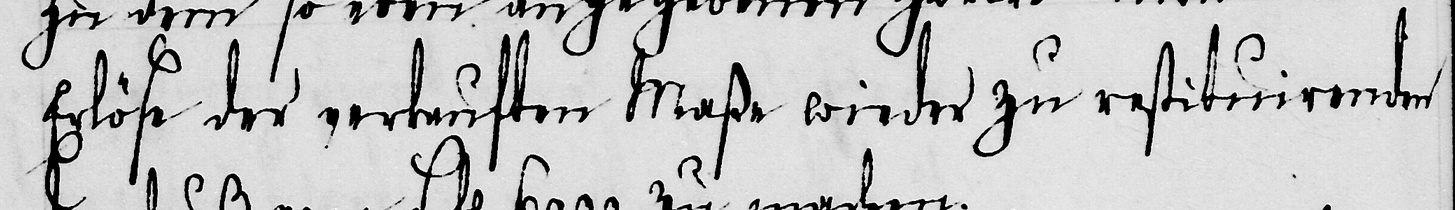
Erlöse der verkauften Maße wieder zu restituirenden
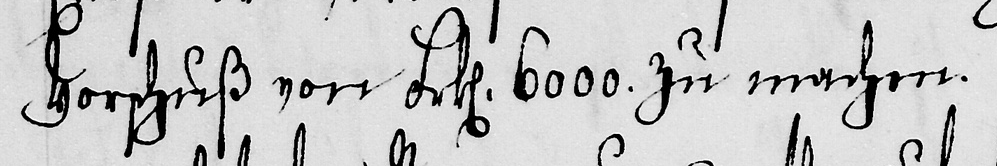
Vorschuß von Frk[en]. 6000. zu machen.
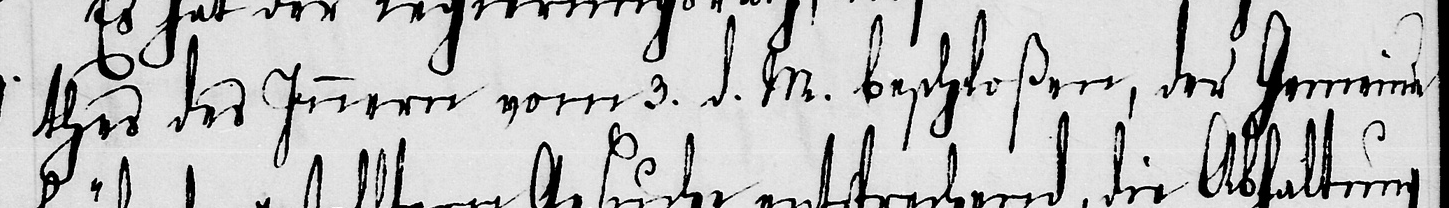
thes des Innern vom 3. d. M. beschlossen, der Gemeinde
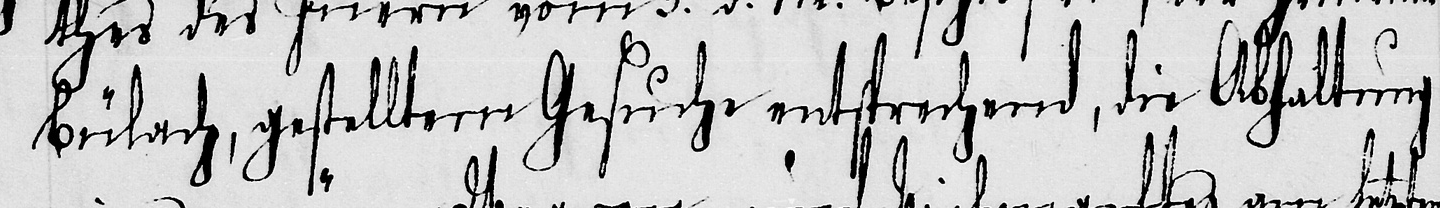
Bülach, gestelltem Gesuche entsprechend, die Abhaltung
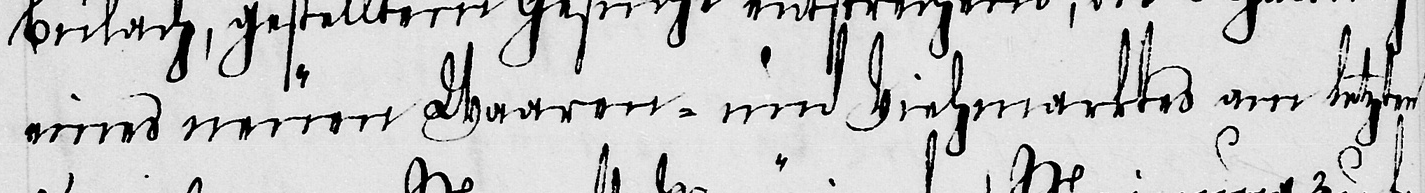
eines neuen Waaren- und Viehmarktes am letzt¬
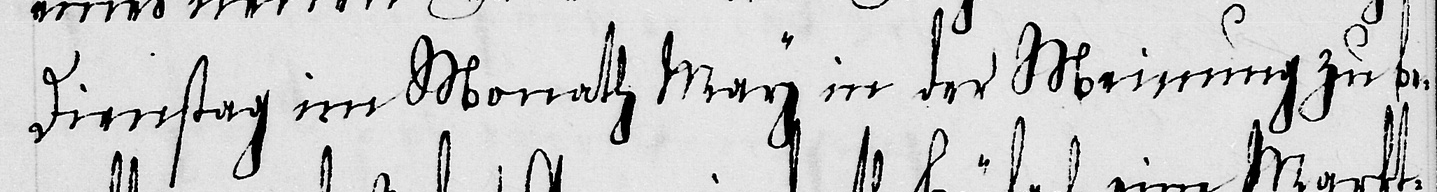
Dienstag im Monath May in der Meinung zu be¬
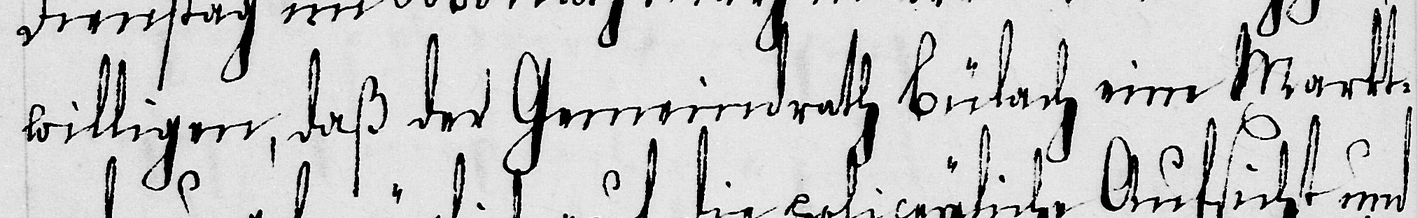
willigen, daß der Gemeindrath Bülach eine Markt¬
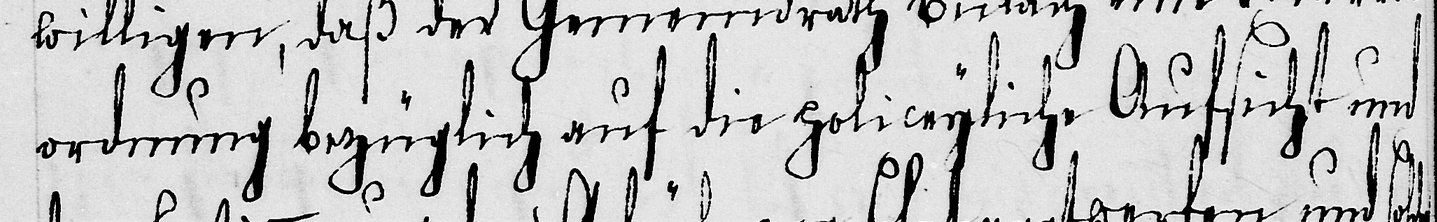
ordnung bezüglich auf die policeyliche Aufsicht und
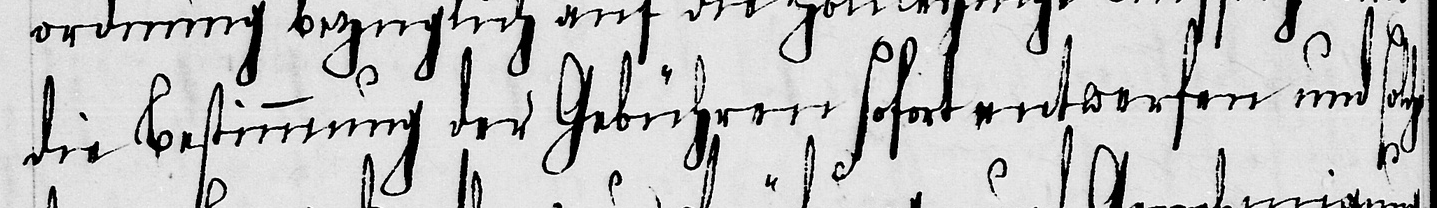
die Bestimmung der Gebühren sofort entwerfen und so¬
